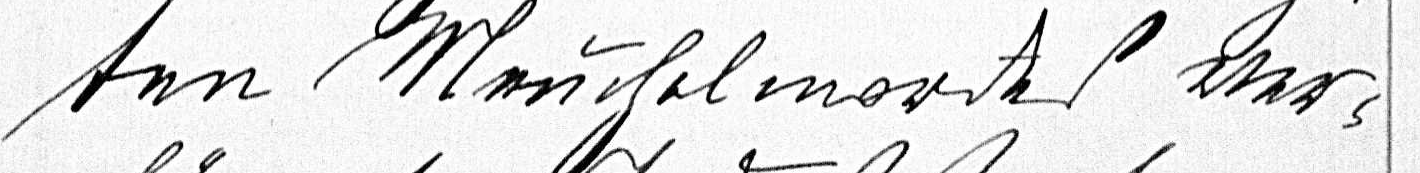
ten Meuchelmordes ver¬
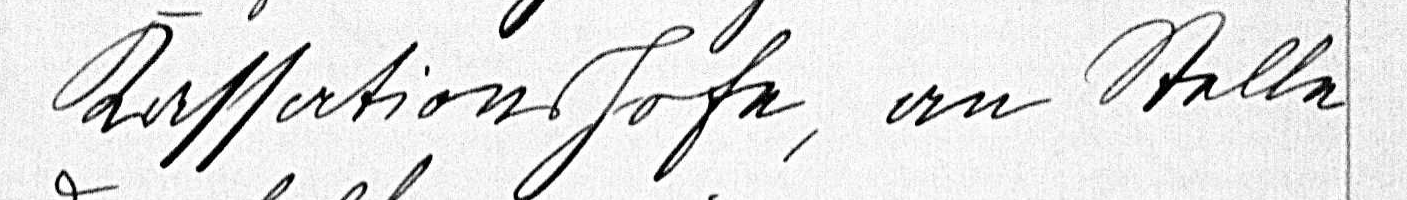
Kassationshofe, an Stelle
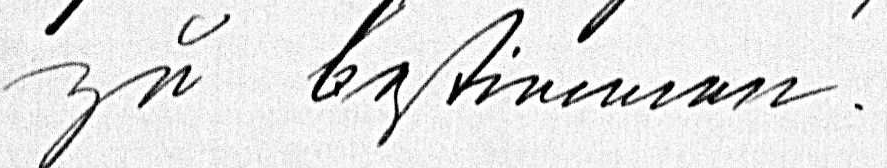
zu bestimmen.
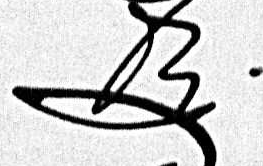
FJ
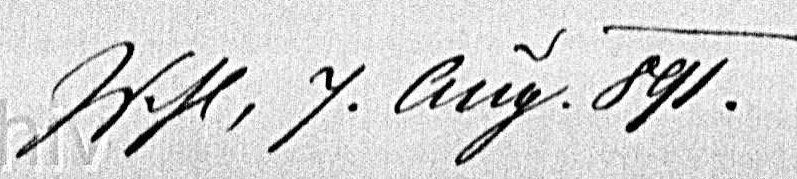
Ischl 7. August 1891
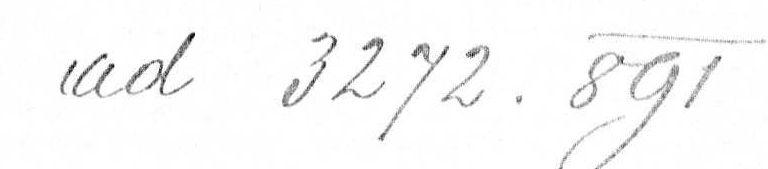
ad 3272 1891
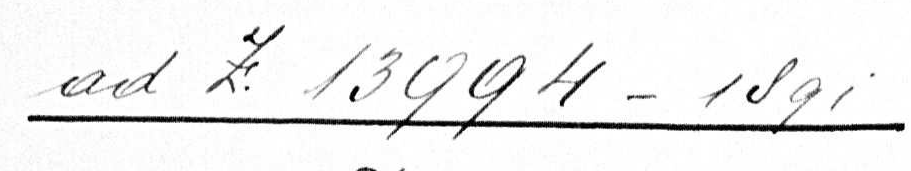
ZZ 13994 – 1891
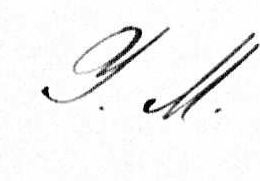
JM
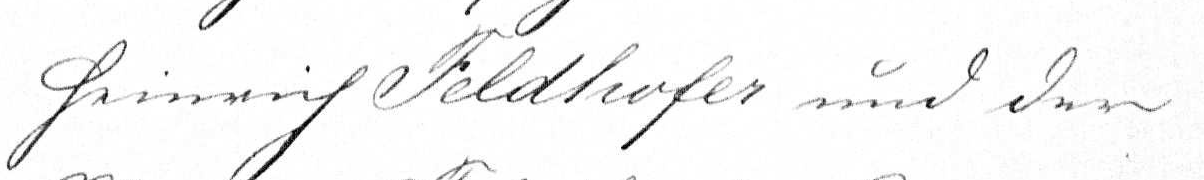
Heinrich Feldhofer und der
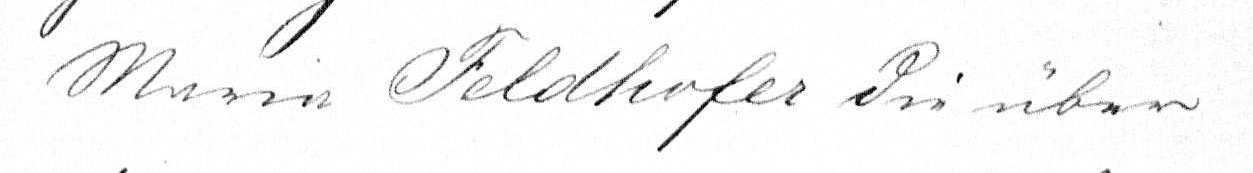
Maria Feldhofer die, über
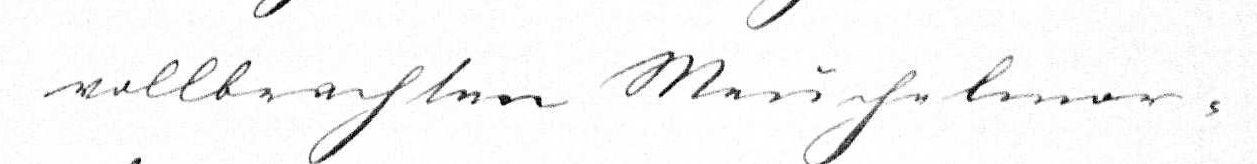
vollbrachten Meuchelmor¬
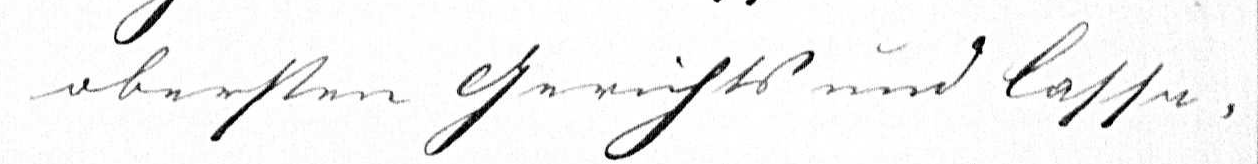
Obersten Gerichts- und Kassa¬
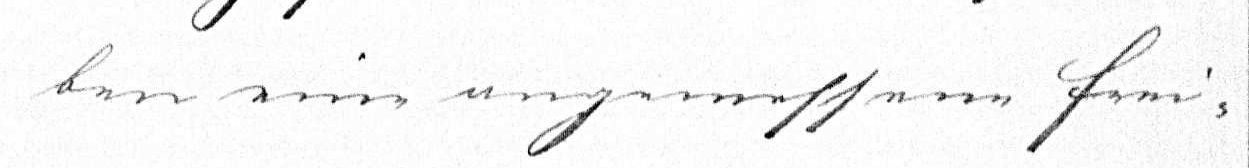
ben eine angemessene Frei¬
